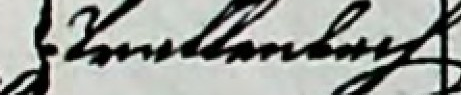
Trattenbach
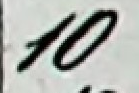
10
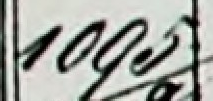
1095/a
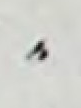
„
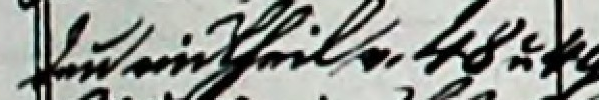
Dann ein Theil v. 48 u 49
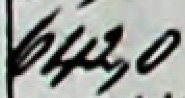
642,0
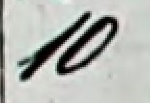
10
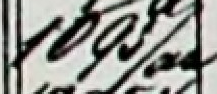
1095/aa
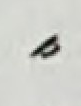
„
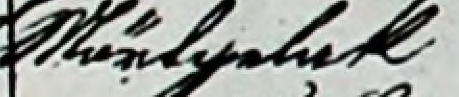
Märtgelak
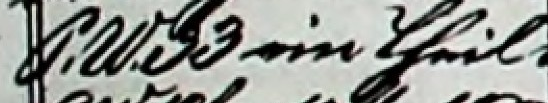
P.W. 33 ein Theil
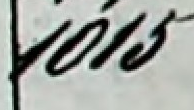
1015
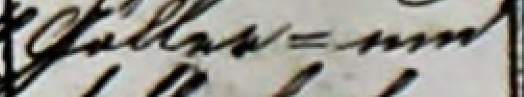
Göller- und
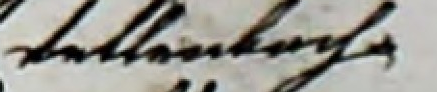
Vettenbach„
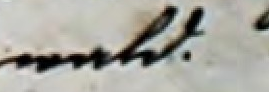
wald.
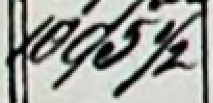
1095 1/2
